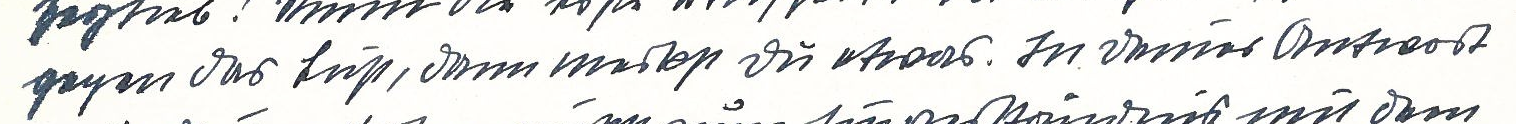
gegen das Licht, dann merkst Du etwas. In Deiner Antwort
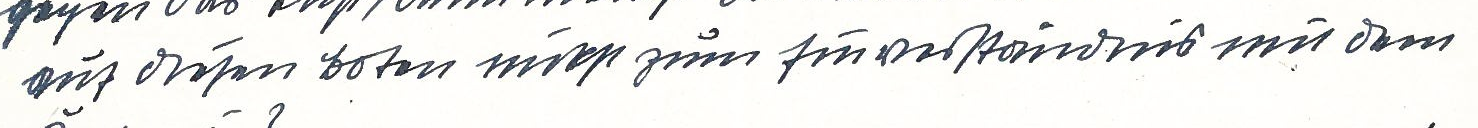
auf diesen Boten nickst zum Einverständnis mit dem
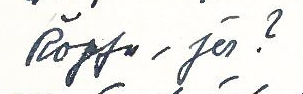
Kopfe, ja?
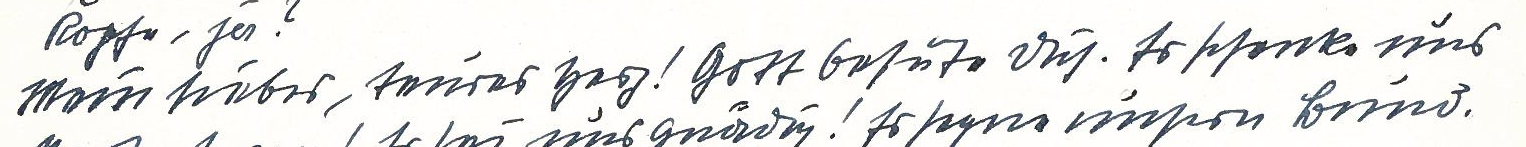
Mein liebes, teures Herz! Gott behüte Dich. Er schenke uns
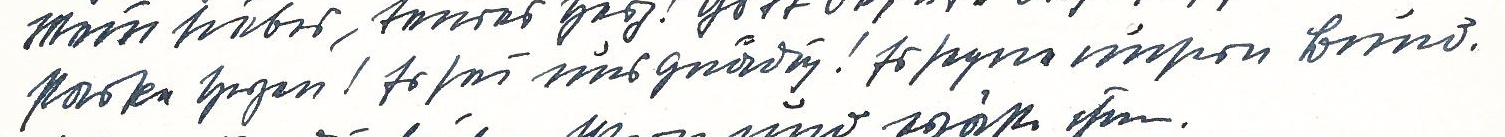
starke Herzen! Er sei uns gnädig! Er segne unsern Bund.
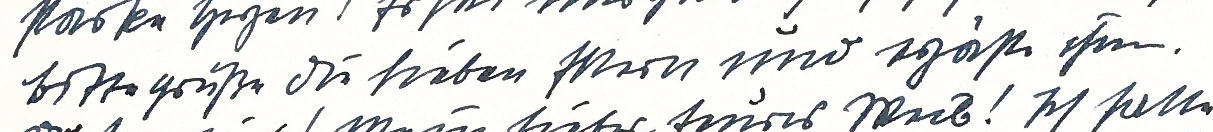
Bitte grüße die lieben Eltern und erzähle ihnn.
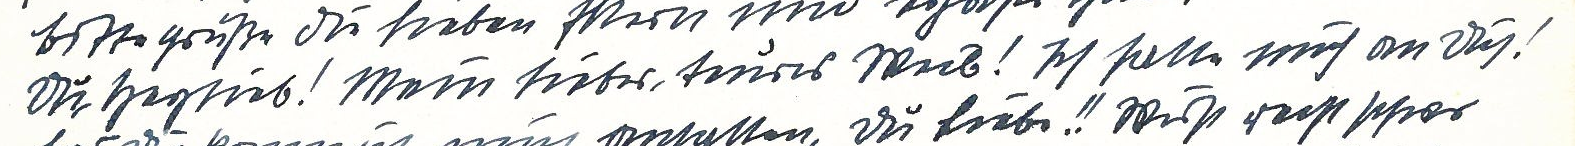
Du Herzlieb! Mein liebes, teures Weib!! Ich halte mich an Dich!
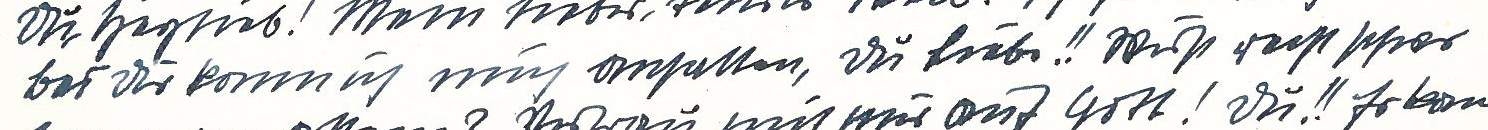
Bei Dir kann ich mich anhalten, Du Liebe!! Wirst recht schwer
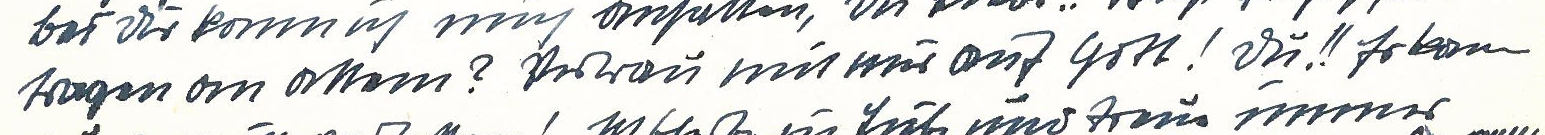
tragen an allem? Vertrau mit mir auf Gott! Du!! Er kann
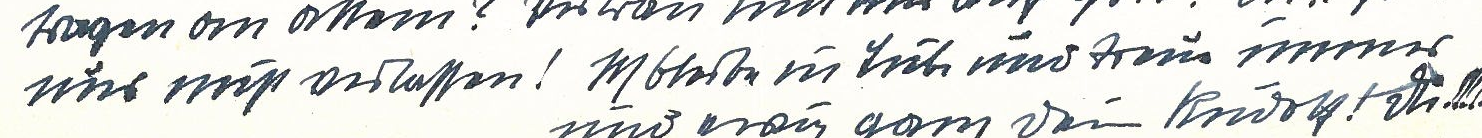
uns nicht verlassen! Ich bleibe in Liebe und Treue immer
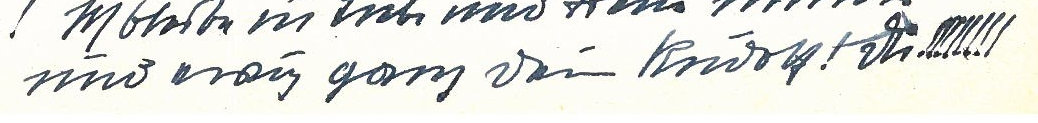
und ewig ganz Dein ! Du!!!!!!!!
